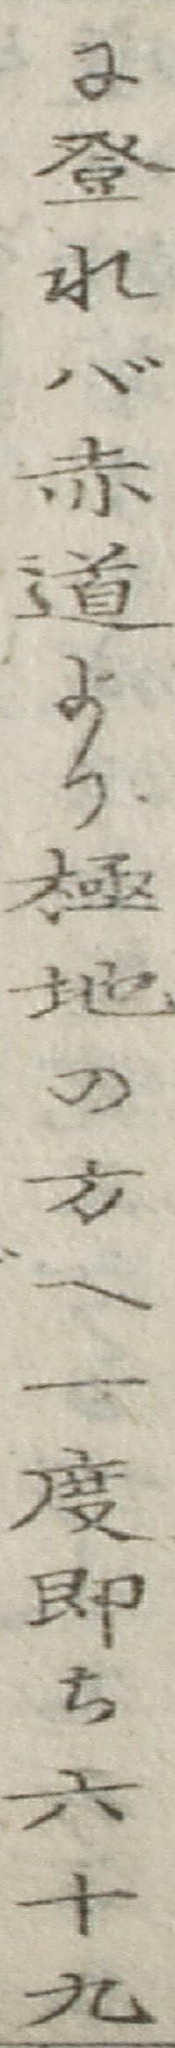に登れば赤道より極地の方へ一度、即ち六十九
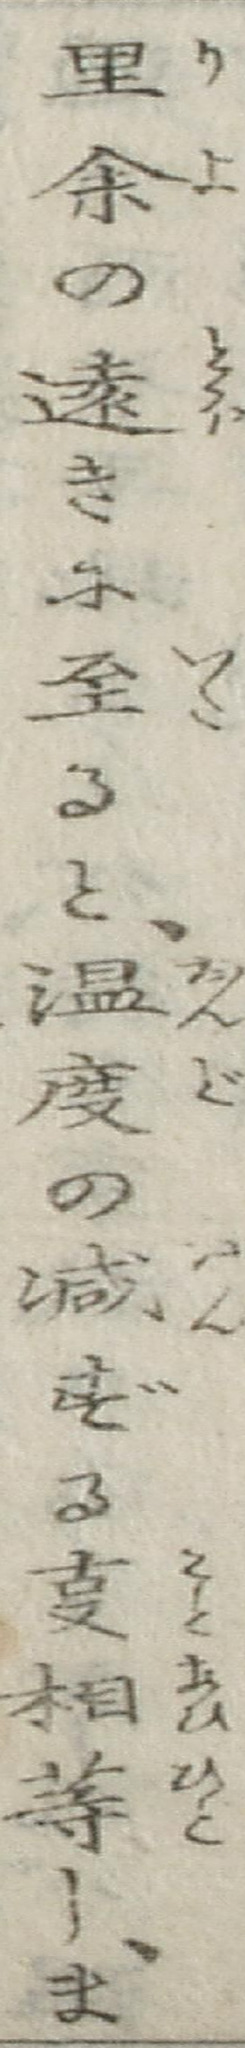里余の遠きに至ると、温度の減ずる事相等し、ま
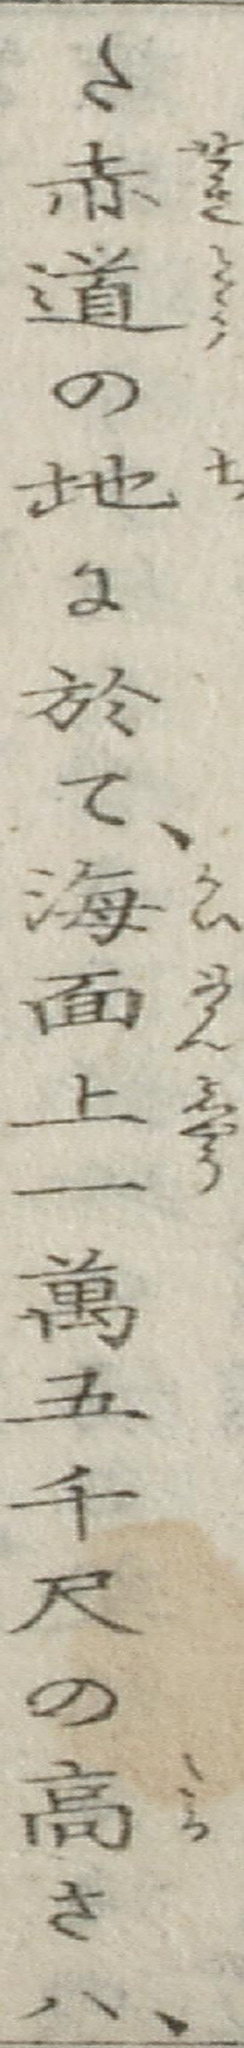た赤道の地に於て、海面上一万五千尺の高さは、
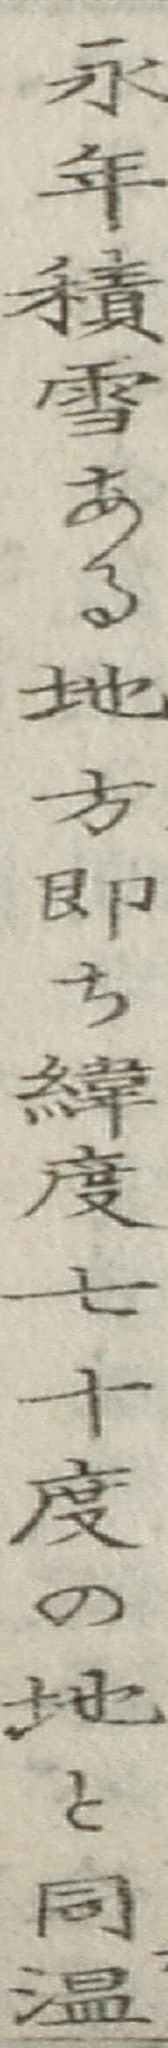永年積雪ある地方、即ち緯度七十度の地と同温
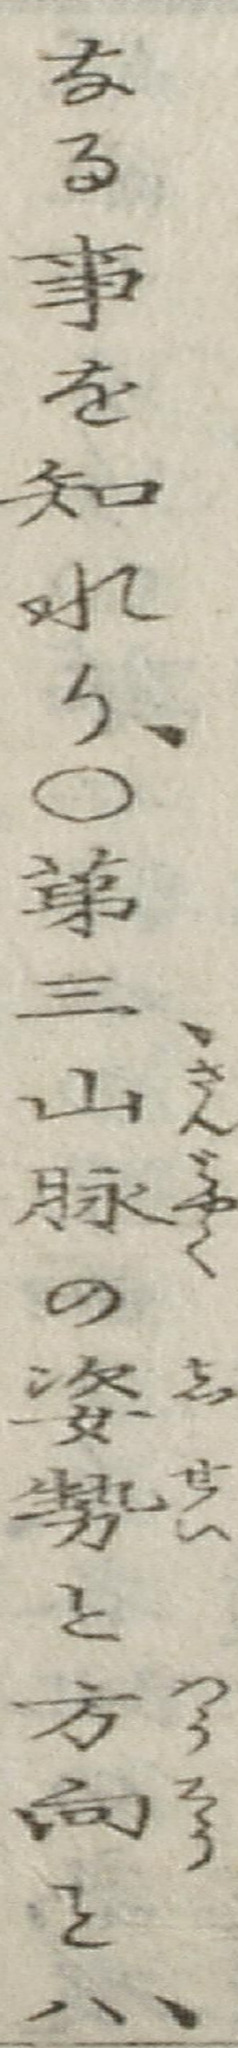なる事を知れり、○第三、山脈の姿勢と方向とは、
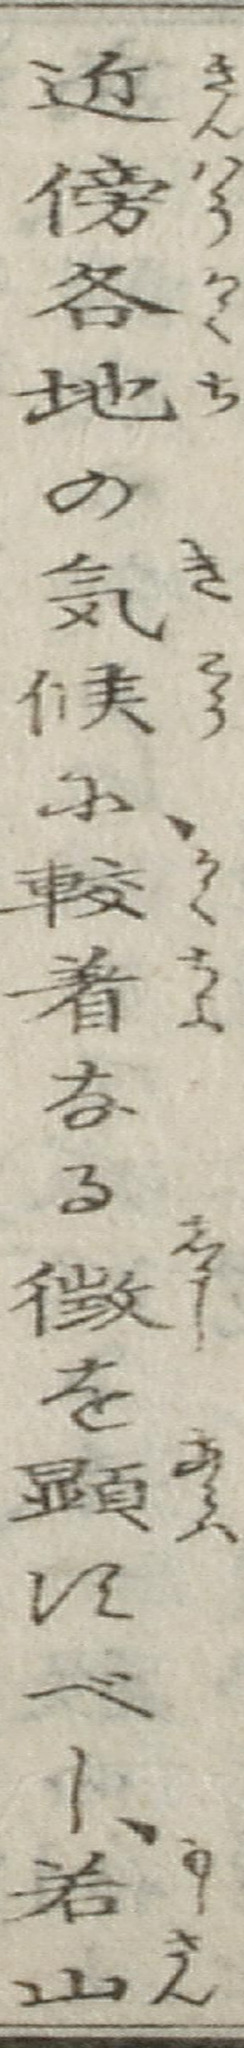近傍各地の気候に、較著なる徴を顕すべし、若山
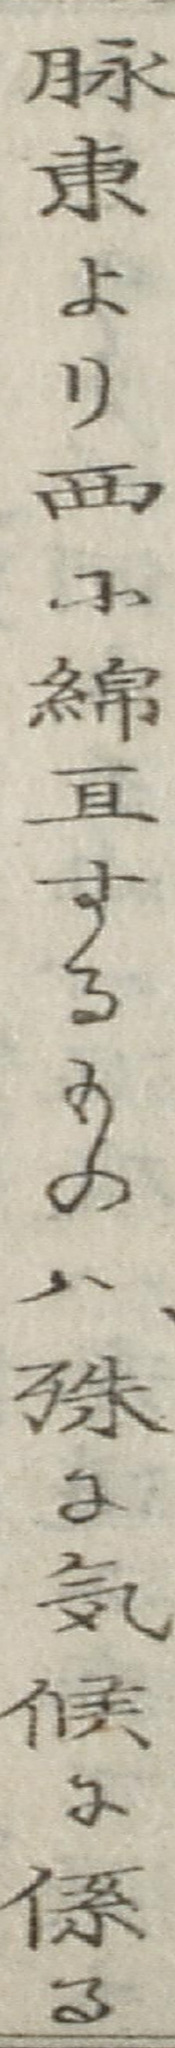脈東より西に綿亘するものは、殊に気候に係る
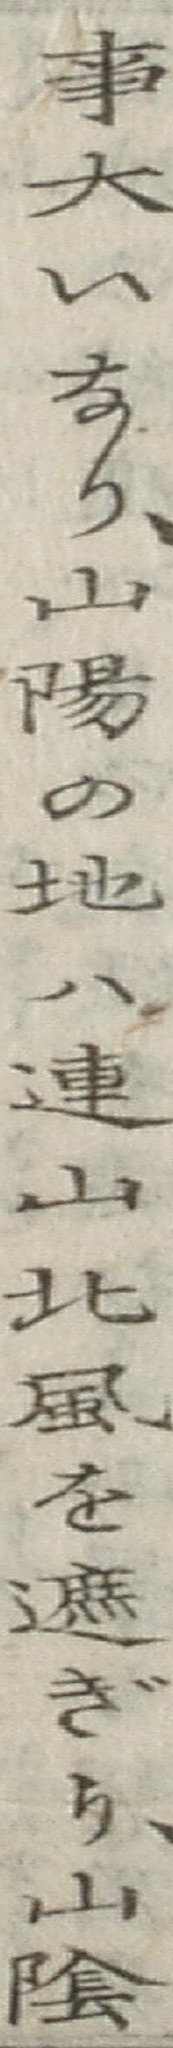事大いなり、山陽の地は連山北風を遮ぎり、山陰
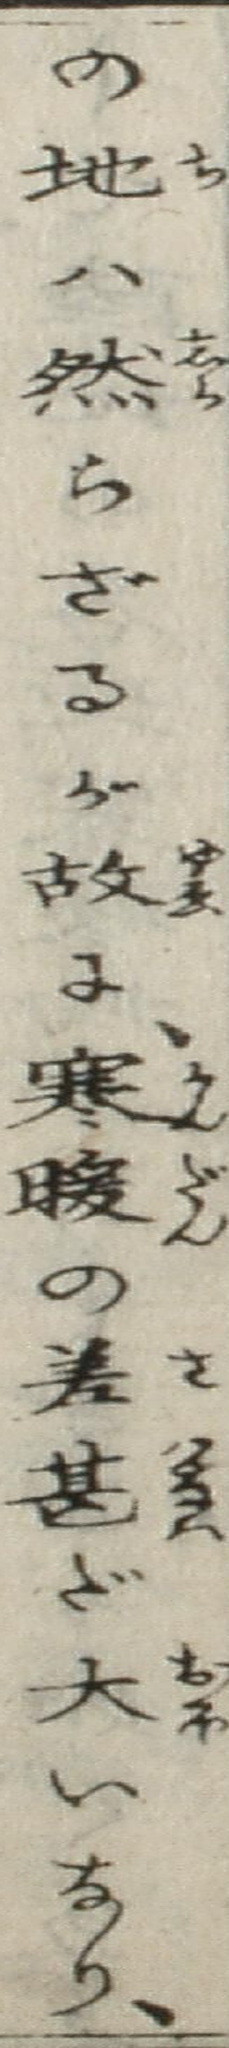の地は然らざるが故に、寒暖の差甚だ大いなり、
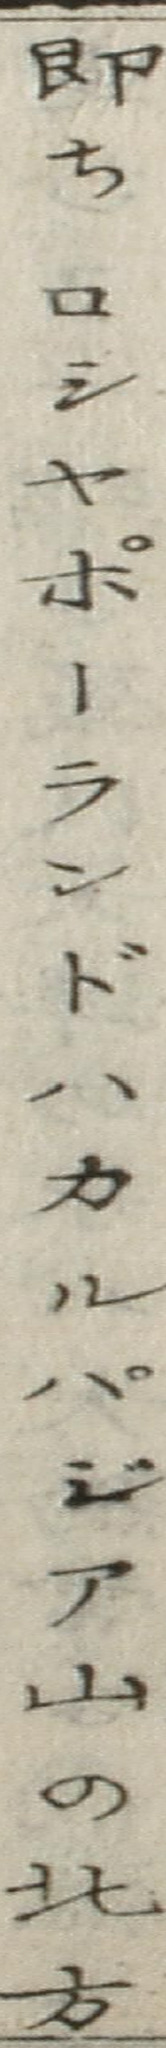即ちロシヤポーランドは、カルパジア山の北方
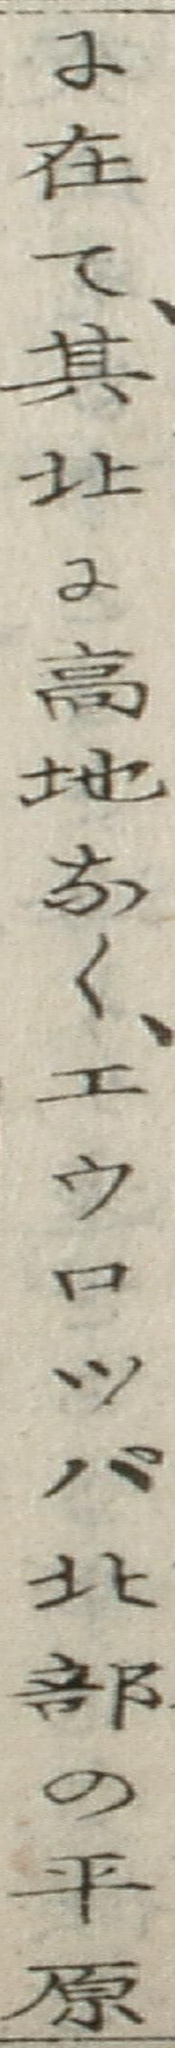に在て、其北に高地なく、エウロツパ北部の平原
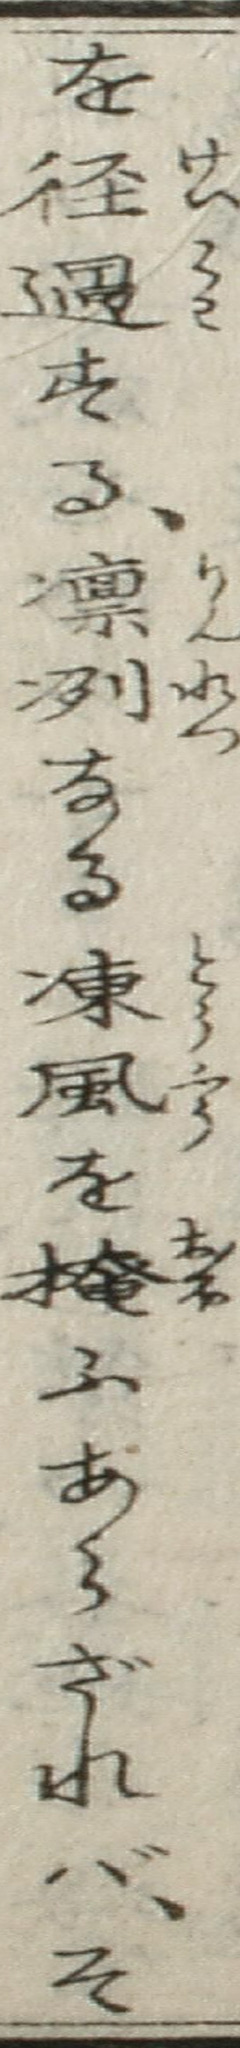を径過する、凛冽なる凍風を掩ふあらざれば、そ
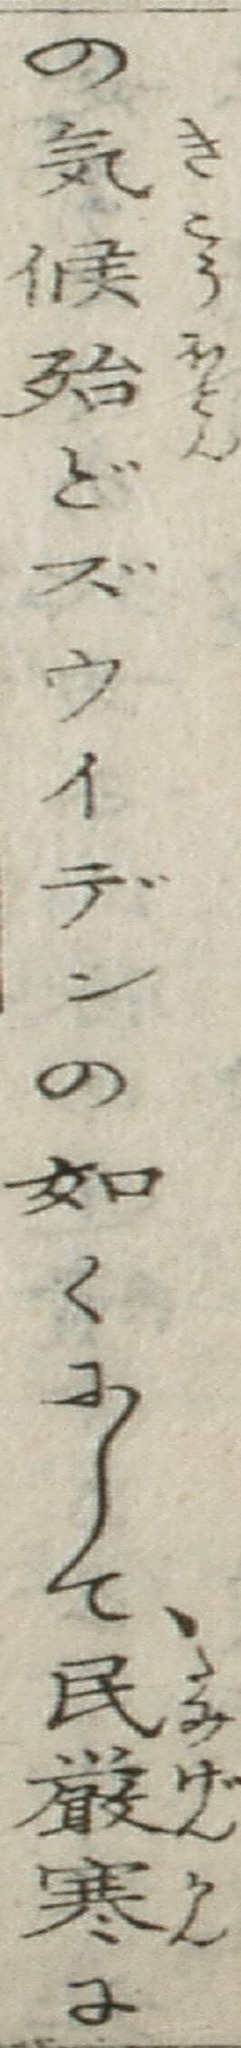の気候殆どズウイデンの如くにして、民厳寒に
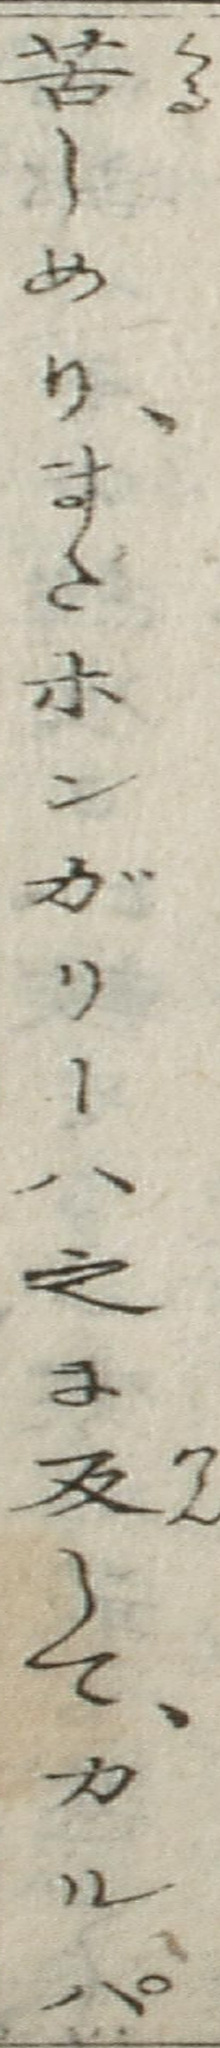苦しめり、またホンガリーは之に反して、カルパ
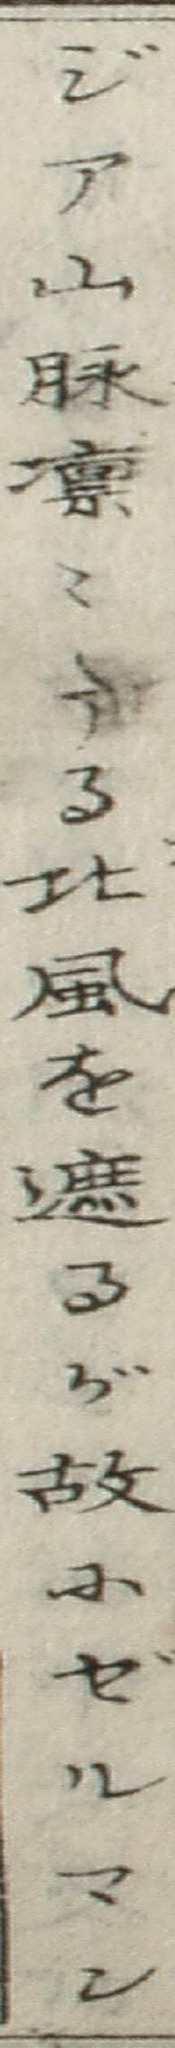ジア山脈凛々たる北風を遮るが故に、ゼルマン
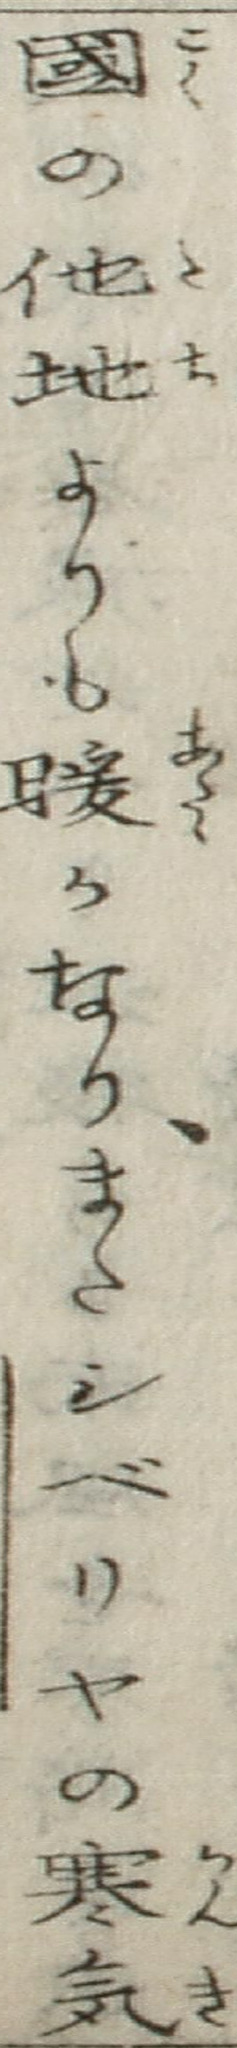国の他地よりも暖かなり、またシベリヤの寒気
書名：訓蒙　天然地理學　下
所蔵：東京大学地震研究所図書室 Earthquake Research Institute Library, The University of Tokyo, JAPAN
